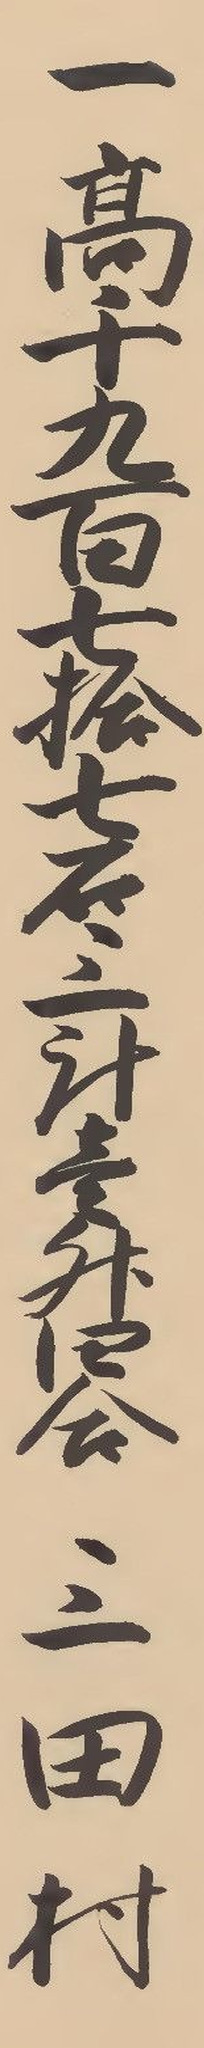一高千九百七拾七石三斗壱升四合三田村
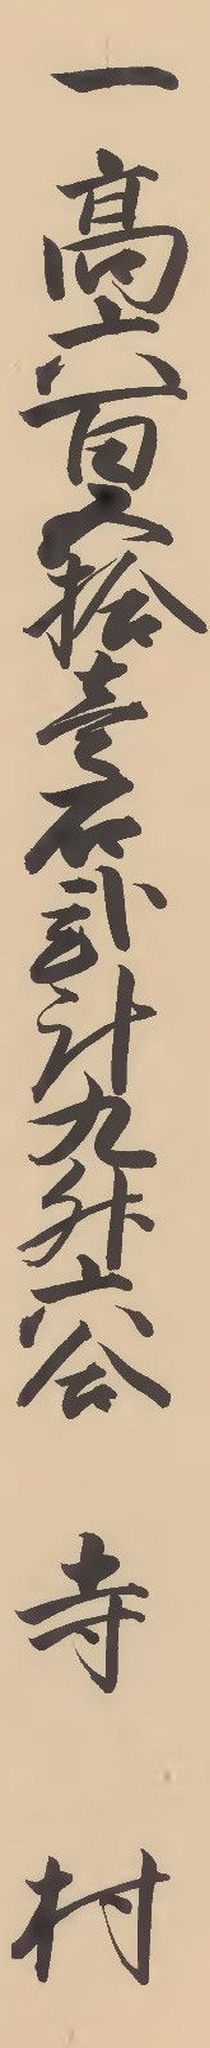一高六百五拾壱石弐斗九升六合寺村
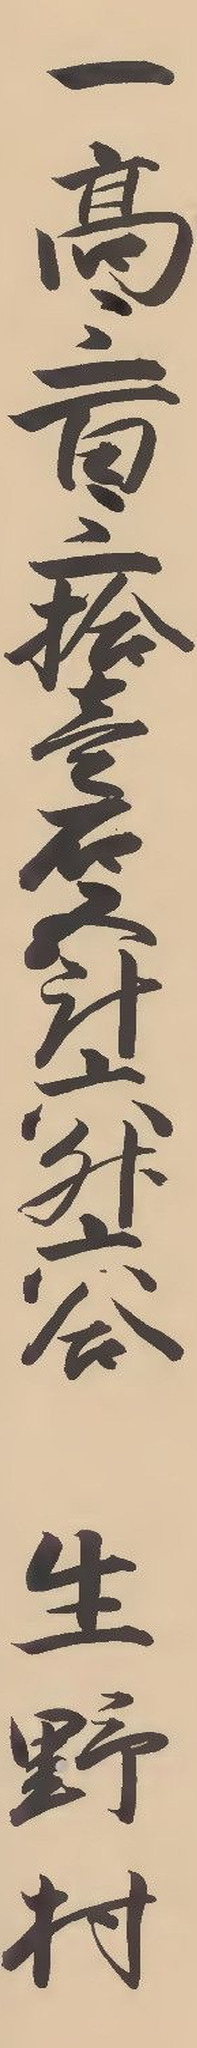一高三百三拾壱石五斗六升六合生野村
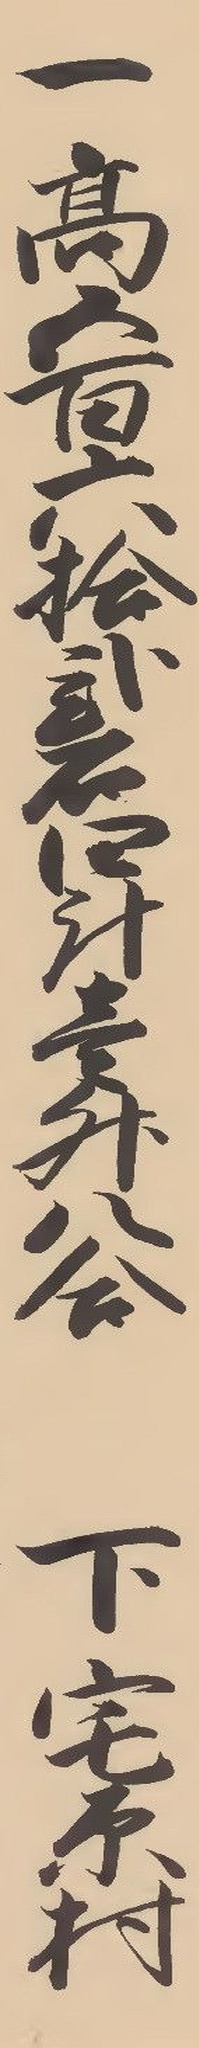一高五百六拾弐石四斗壱升八合下宅原村
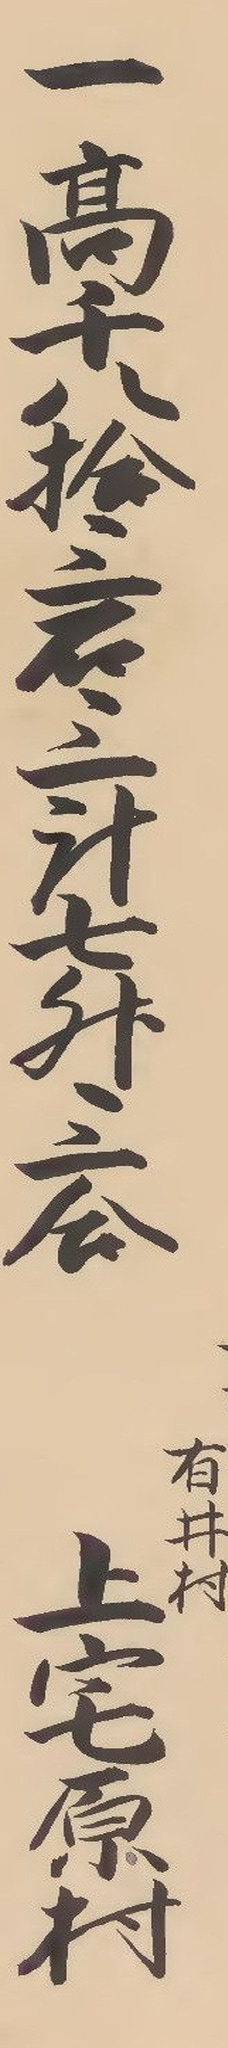一高千八拾三石三斗七升三合上宅原村

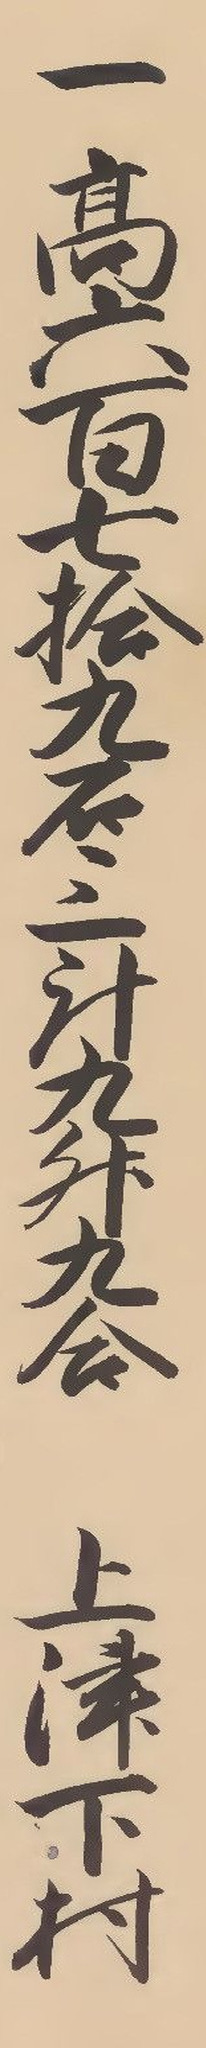一高六百七拾九石三斗九升九合上津下村
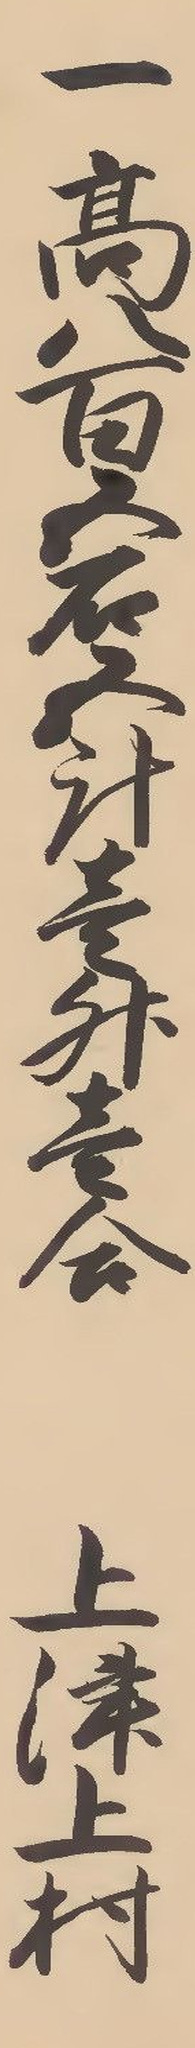一高八百五石五斗壱升壱合上津上村
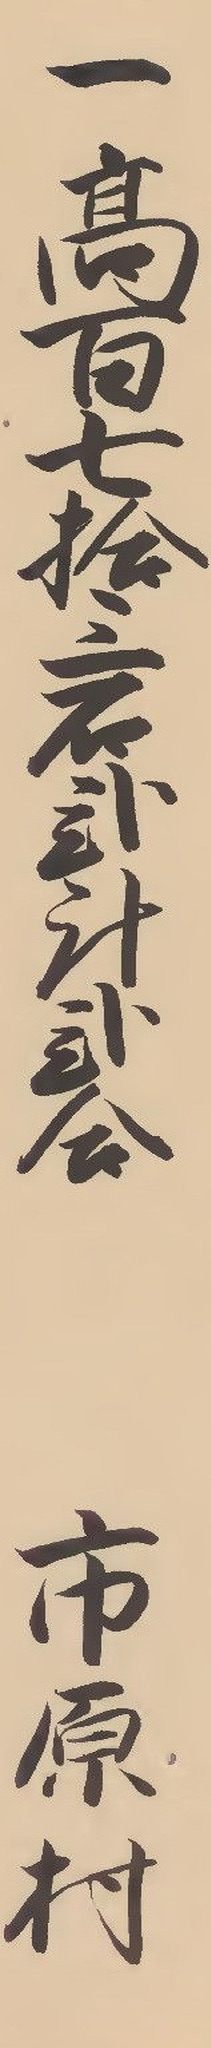一高百七拾三石弐斗弐合市原村
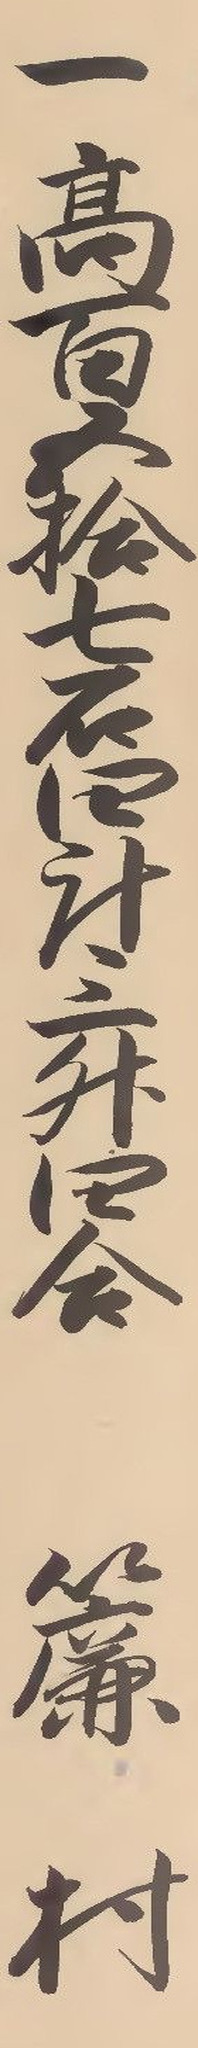一高百五拾七石四斗三升四合簾村
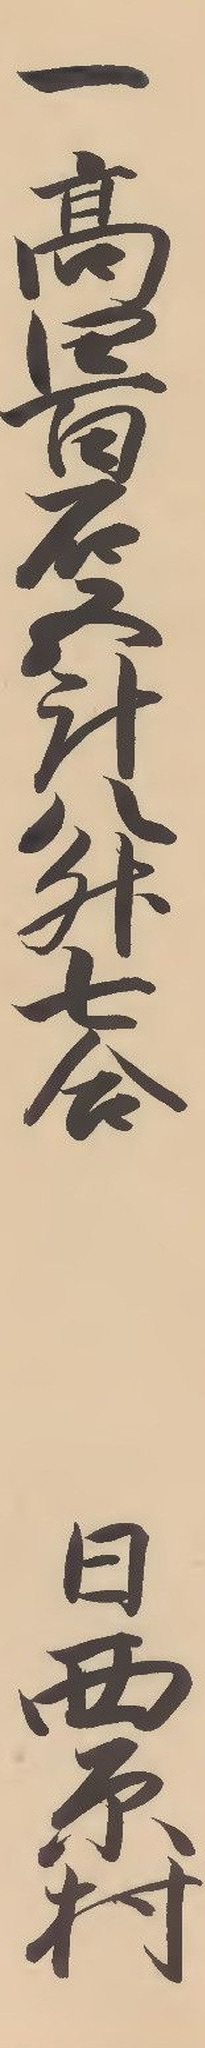一高四百五斗八升七合日西原村
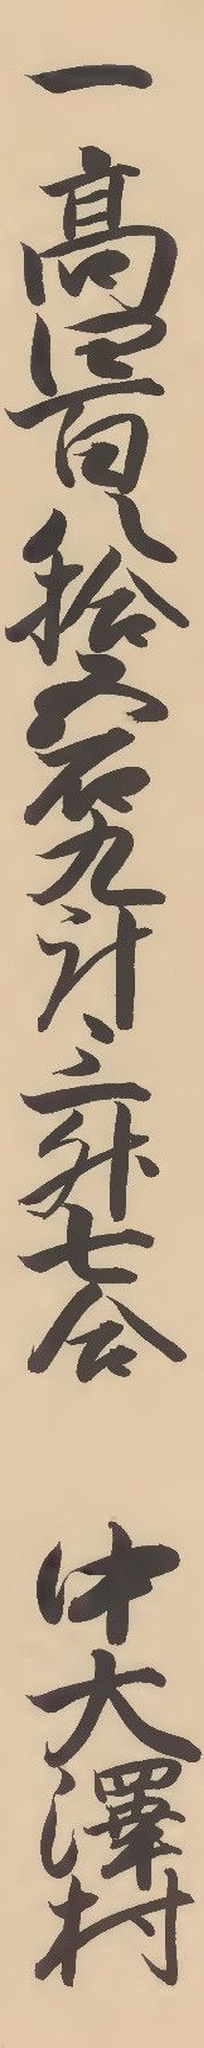一高四百八拾五石九斗三升七合中大沢村
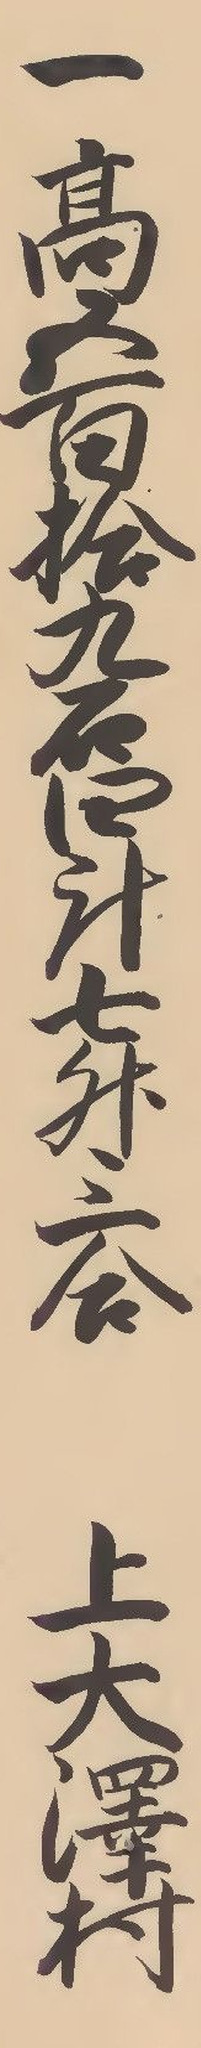一高五百拾九石四斗七升三合上大沢村

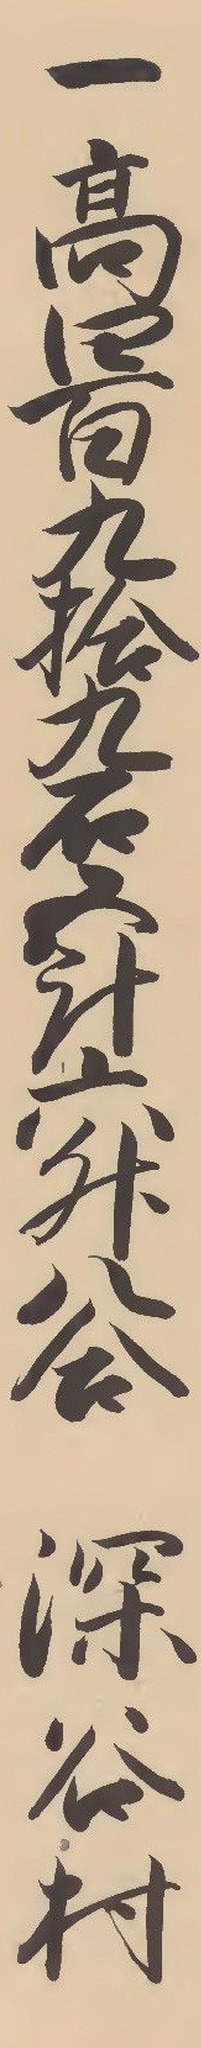一高四百九拾九石五斗六升八合深谷村
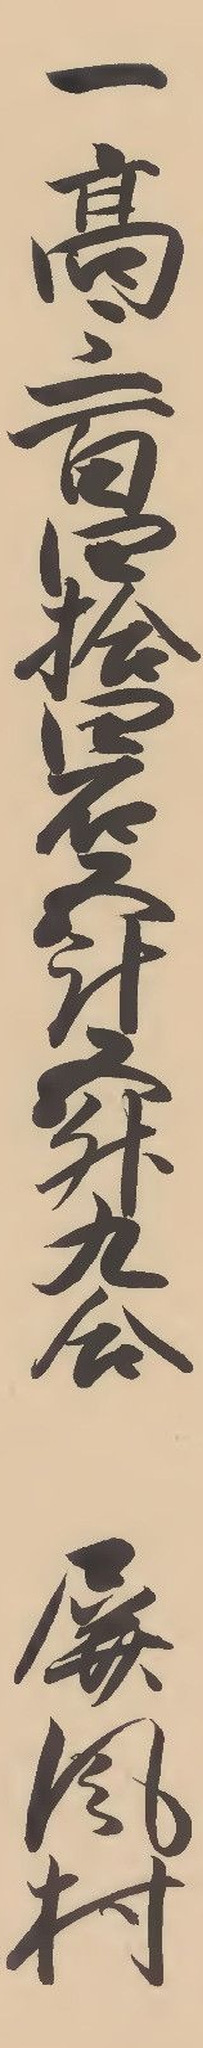一高三百四拾四石五斗五升九合屏風村
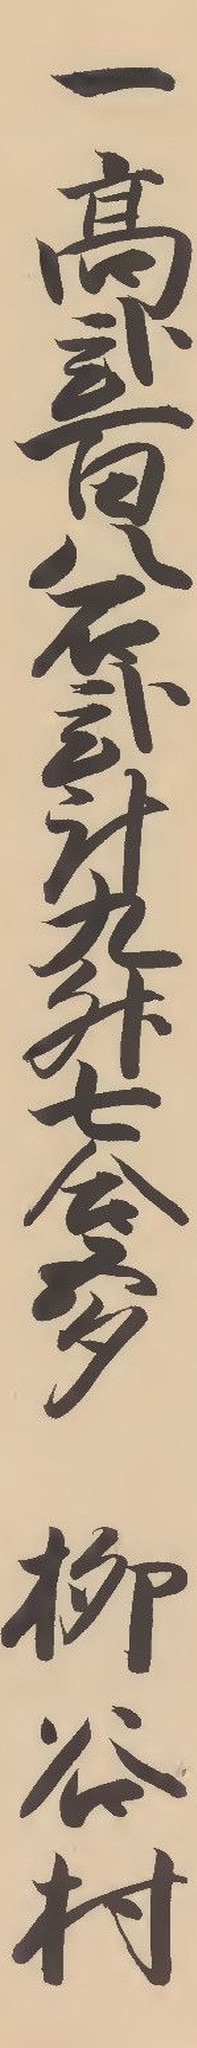一高弐百八石弐斗九升七合五勺柳谷村
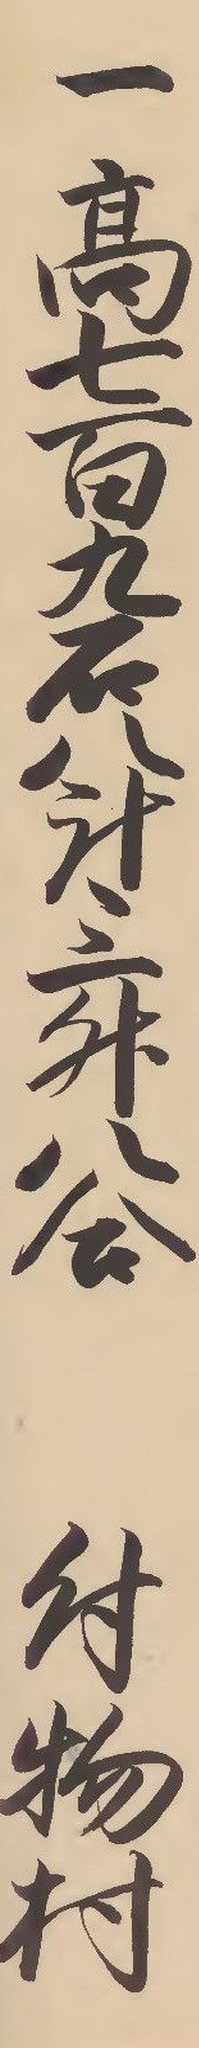一高七百九石八斗三升八合付物村
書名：摂津国郷帳
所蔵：国立公文書館 National Archives of Japan
